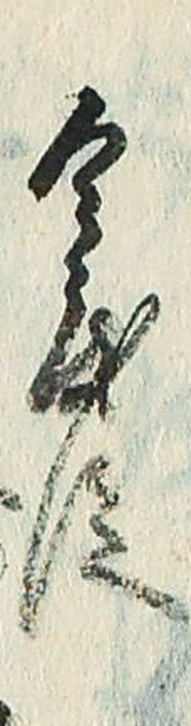今度従
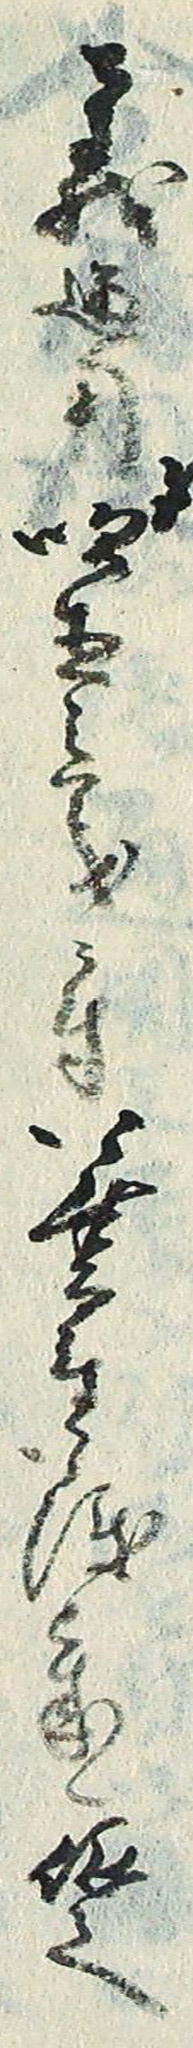公義通用銀吹直之義に付御書付御渡被成候依之
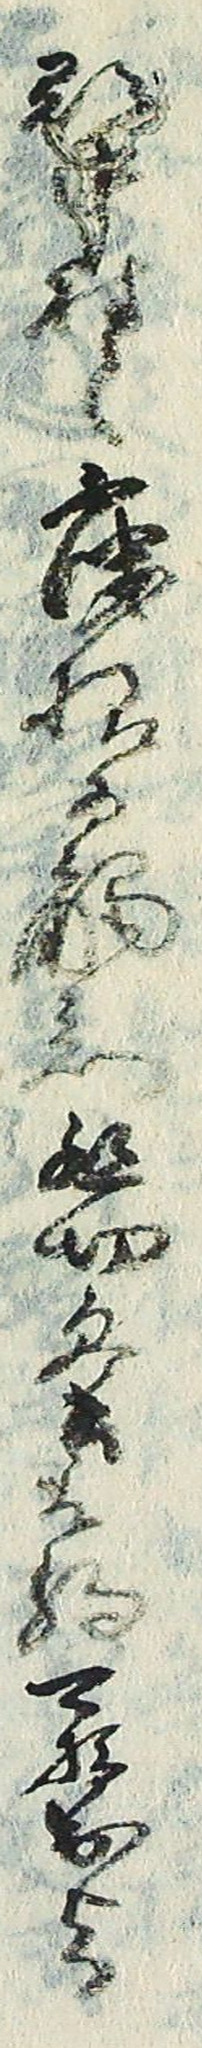郡中村々不洩様為触知組切受書取都可指出旨
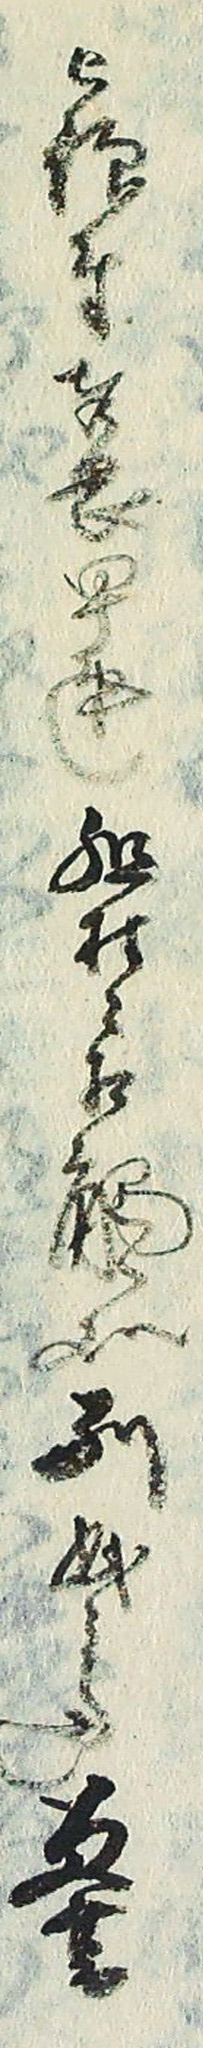被仰付奉畏早速組村々相触候処別紙之通御受書
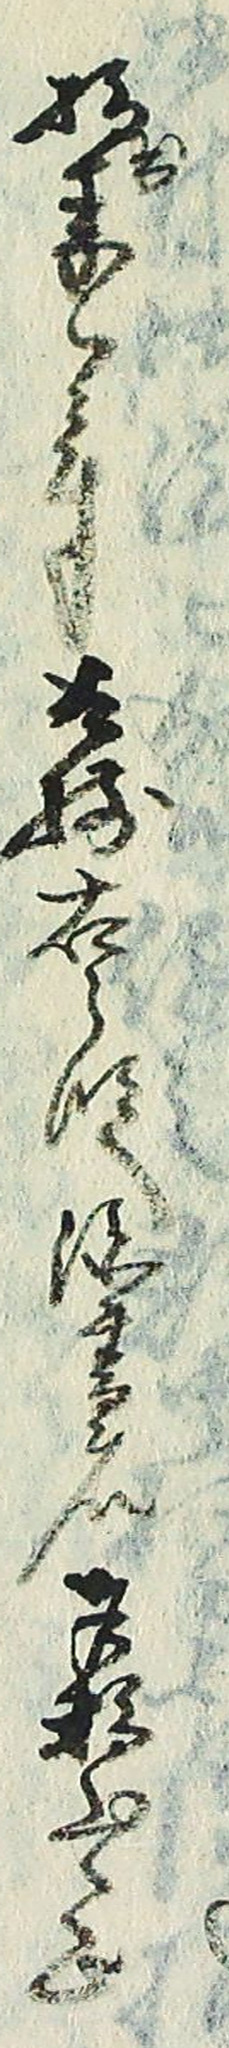指出来候に付取揃右之段添書を以奉指上候以上
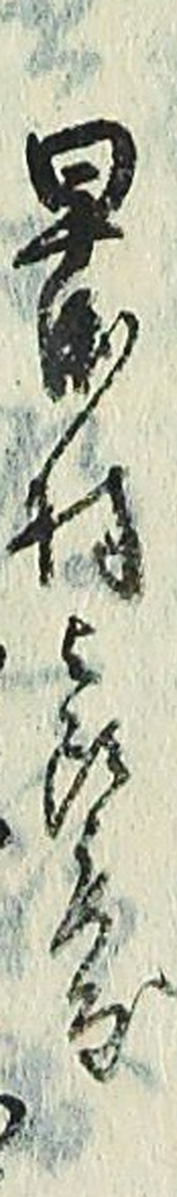早渕村与頭庄屋
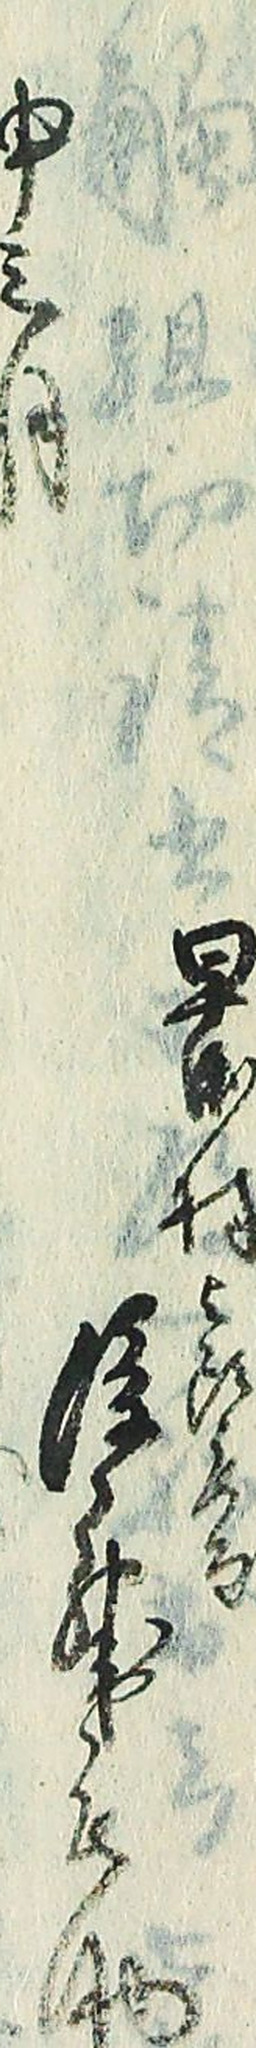申三月後藤庄助
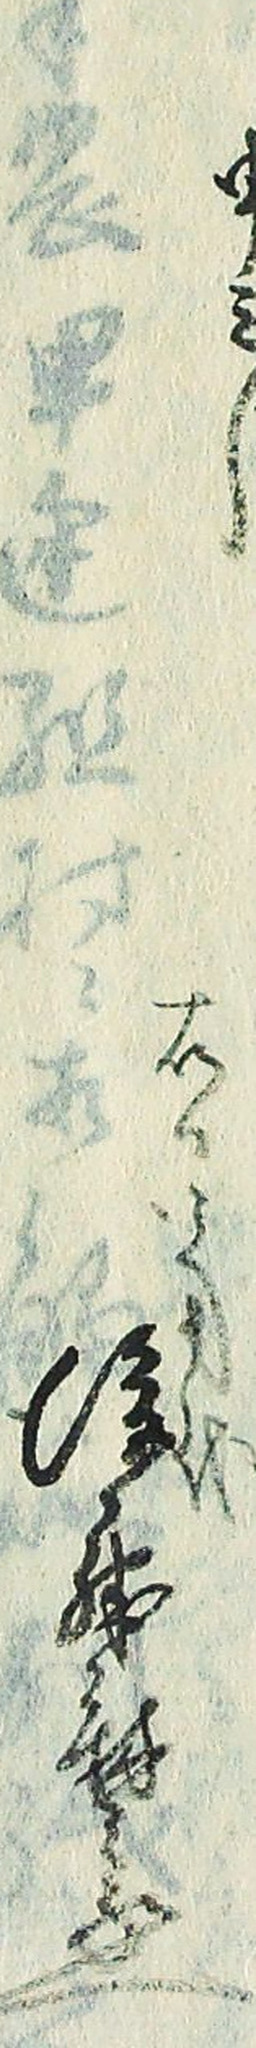後藤麻之丞
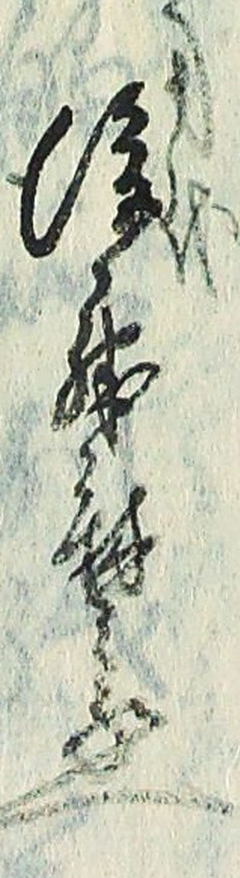後藤麻之丞
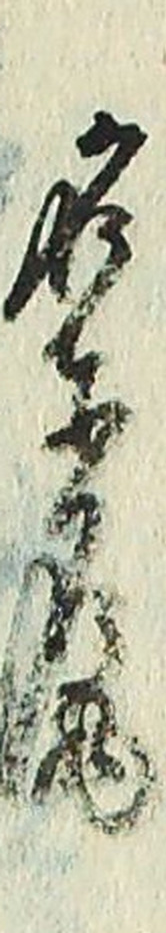名東名西
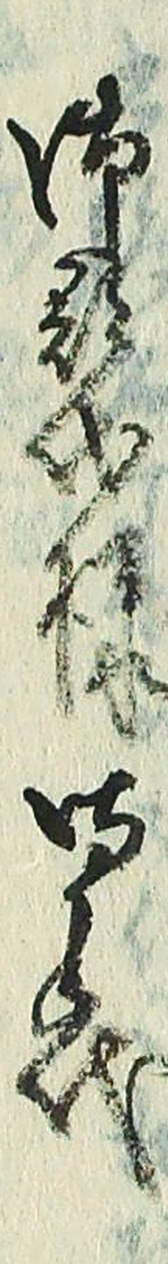御郡代様御手代
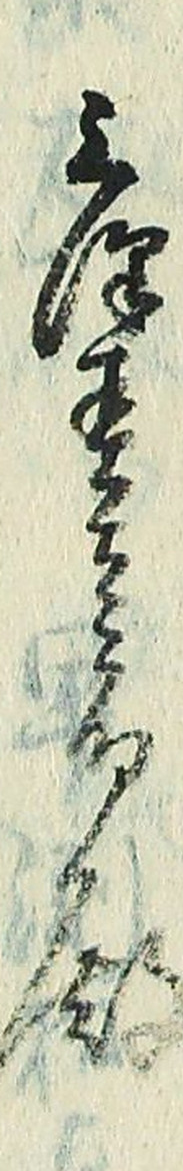三沢春太郎殿
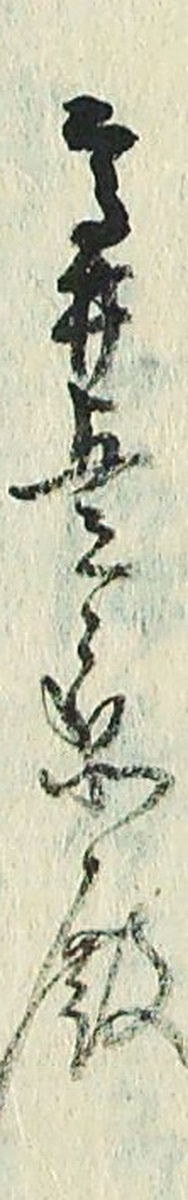高井与三兵衛殿
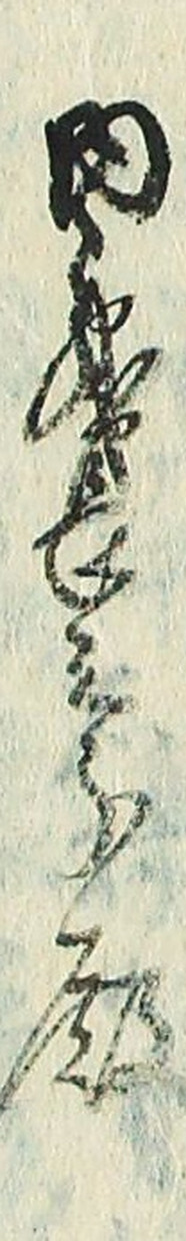内藤長三郎殿
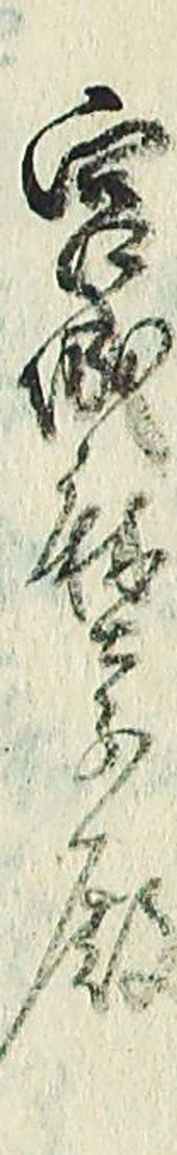宮城麻太郎殿

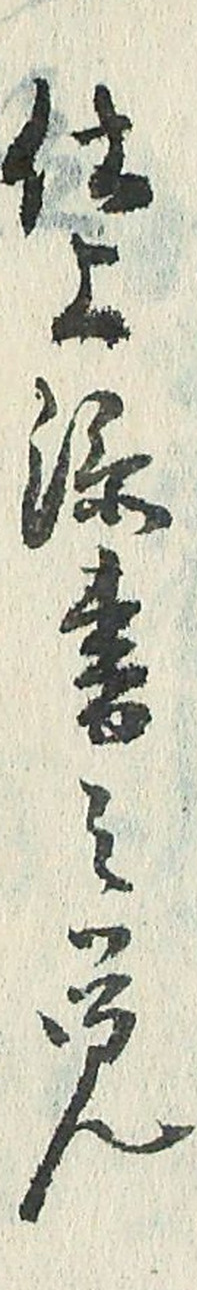仕上添書之覚
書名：諸御用御□受書控
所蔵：鳴門教育大学 Naruto University of Education
